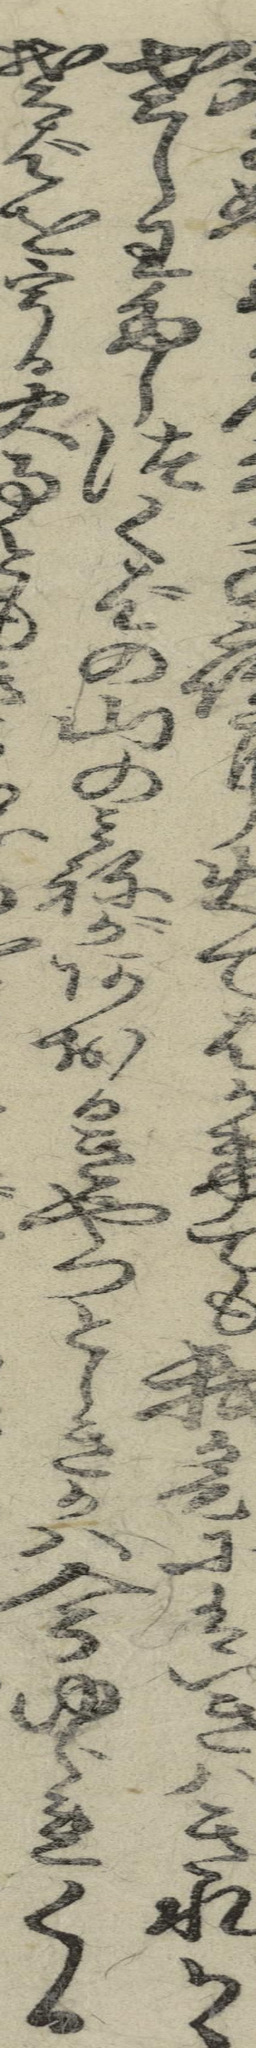さしわたしつくばの山のみねがあおるきやつとしきかは今ゆられくる
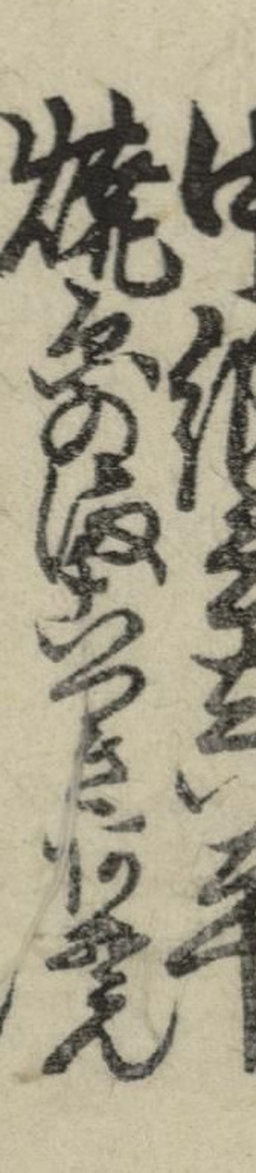焼原のまこつきあそん
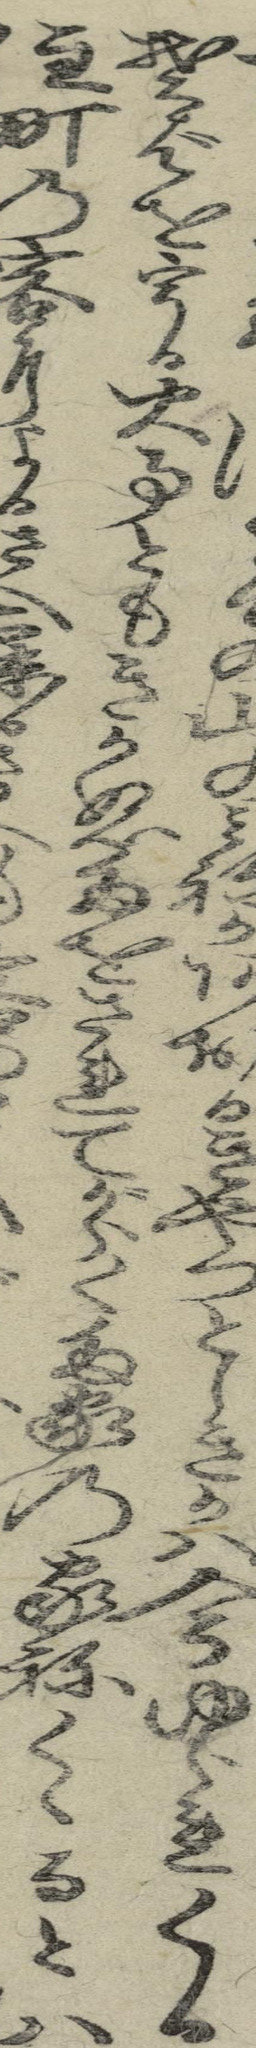そばをうる火事ともきかぬたをされてがらくた家の家ねくゝるとは
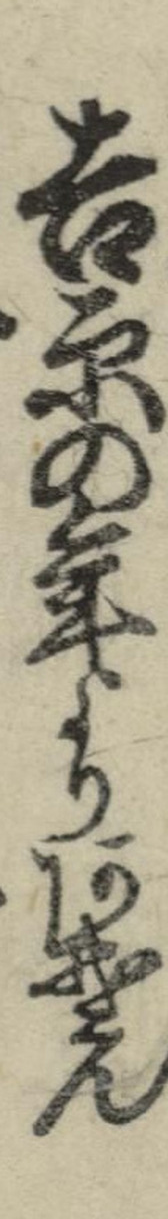吉原の年よりあそん
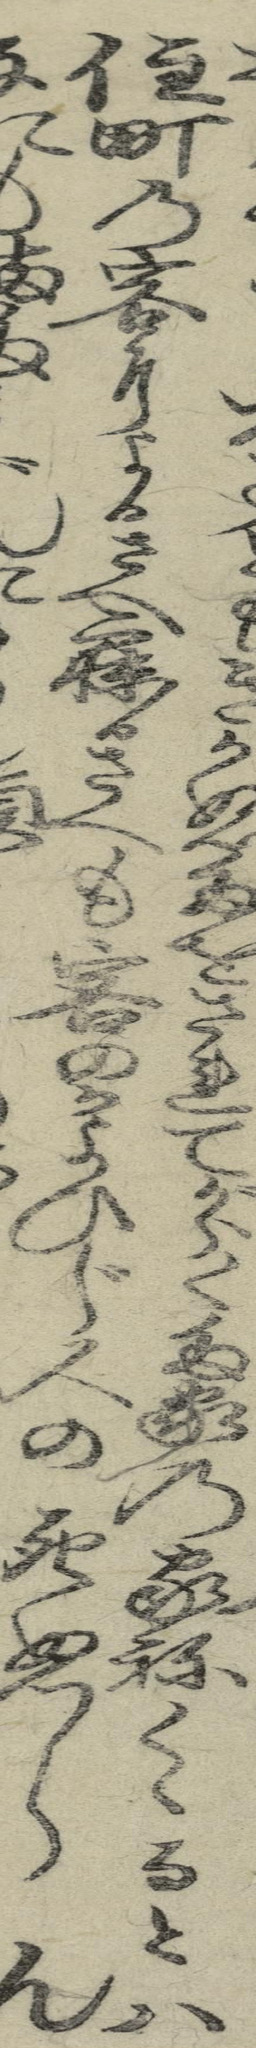住町の客によるさへ寝るさへも客のかよひじ人の死ぬらん
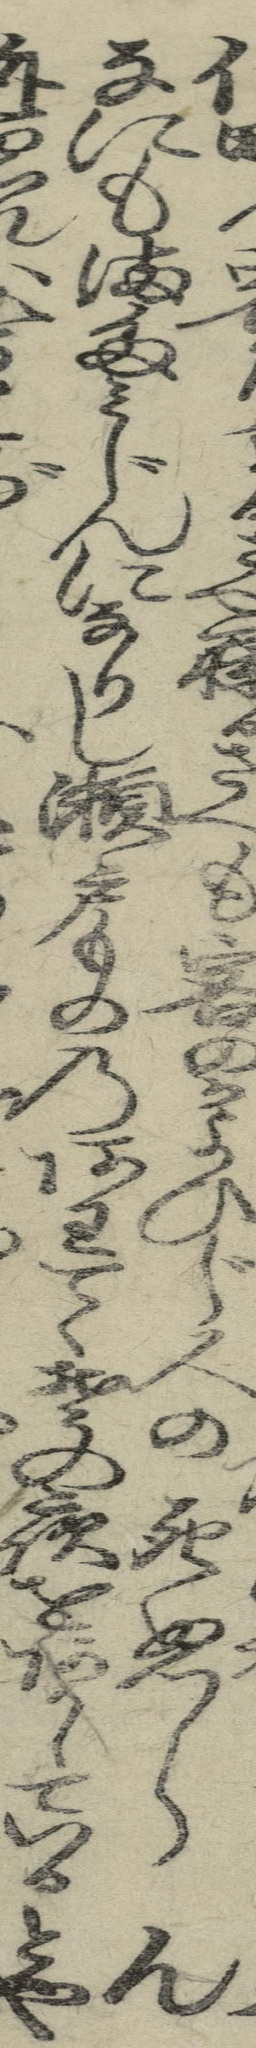なにもまたみじんになりし瀬戸もののあわてゝその夜をあかしているとや
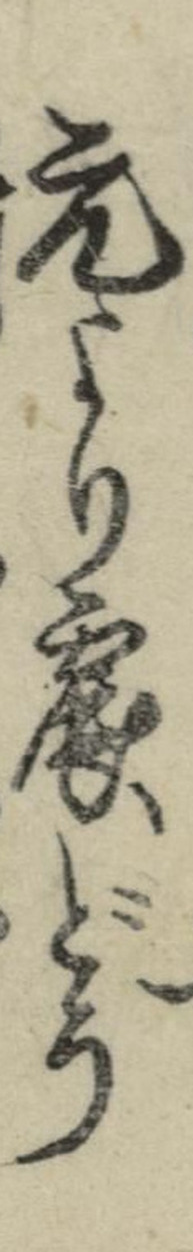元より震どう
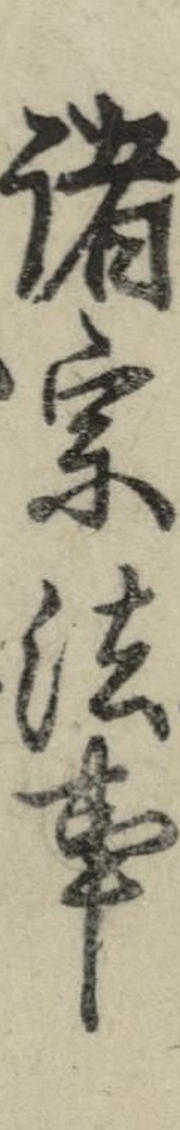諸宗法事
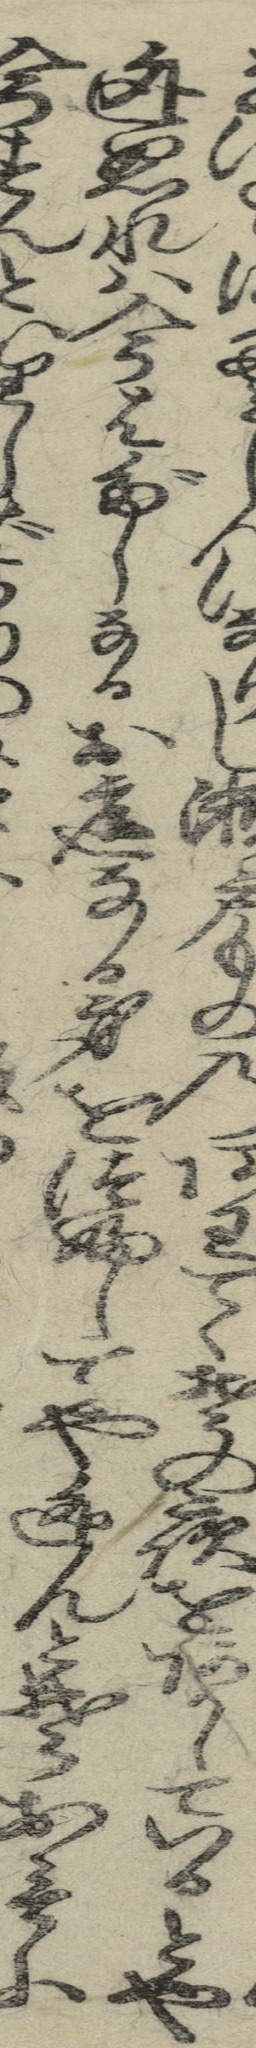逃ぬれは今はだしなるお庭なる身をつふしてや逃んとそおもふ
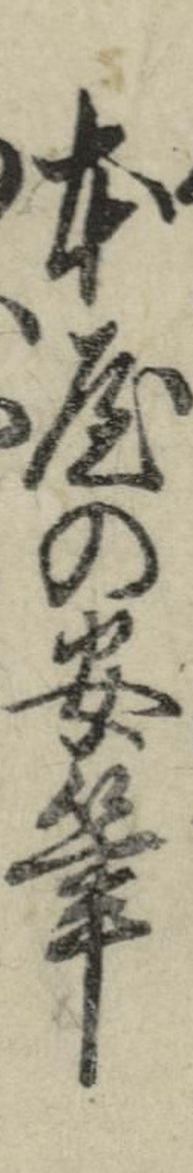本屋の安筆
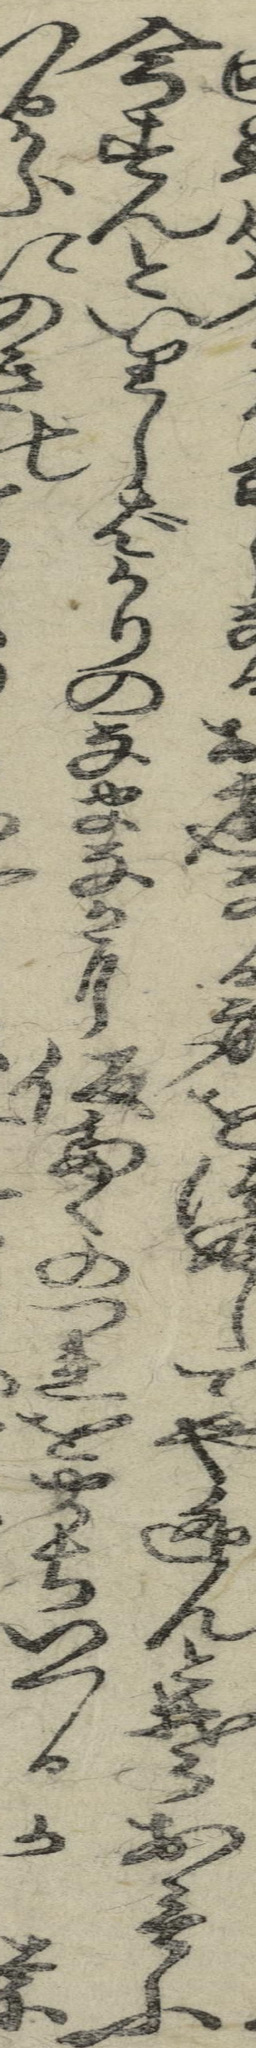今すんといりしばかりのなまなかに仮たくのつれをまちいつるかな
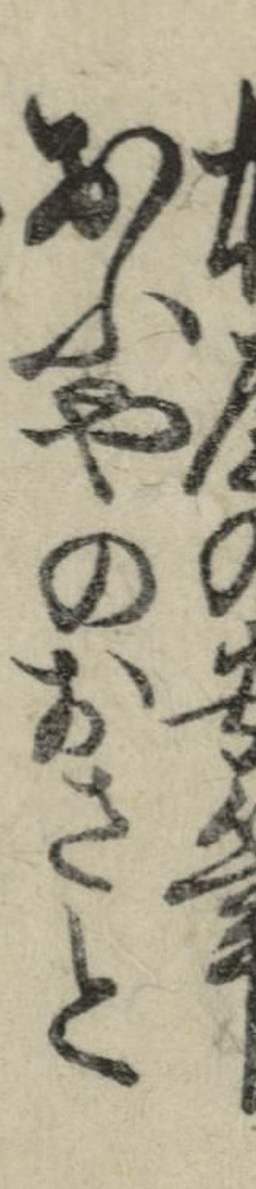おふやのおさと
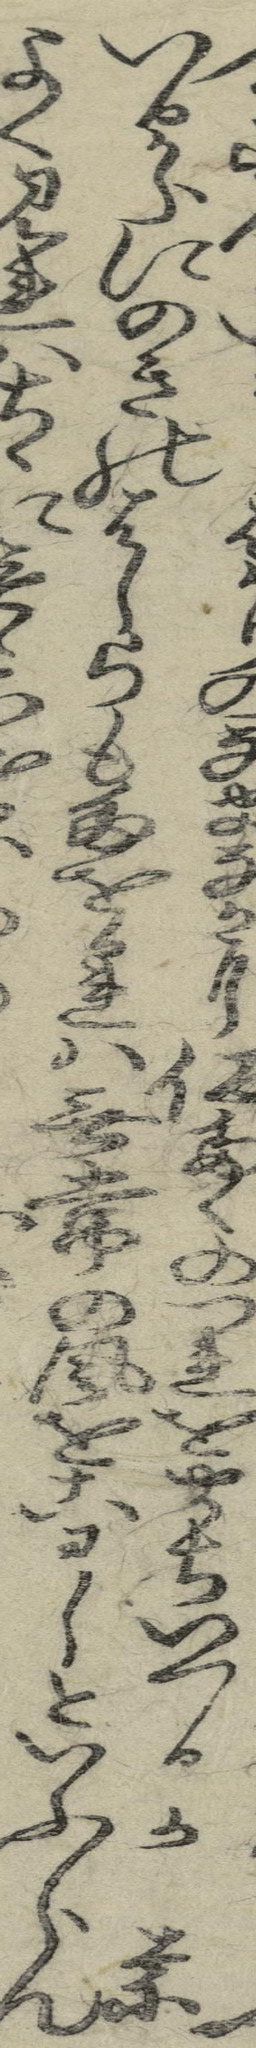いるからにのきのはしらもたをるれは無常の風をこわしといふらん
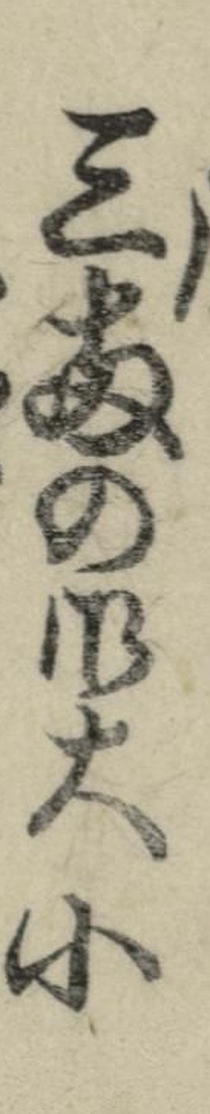三両の御大小
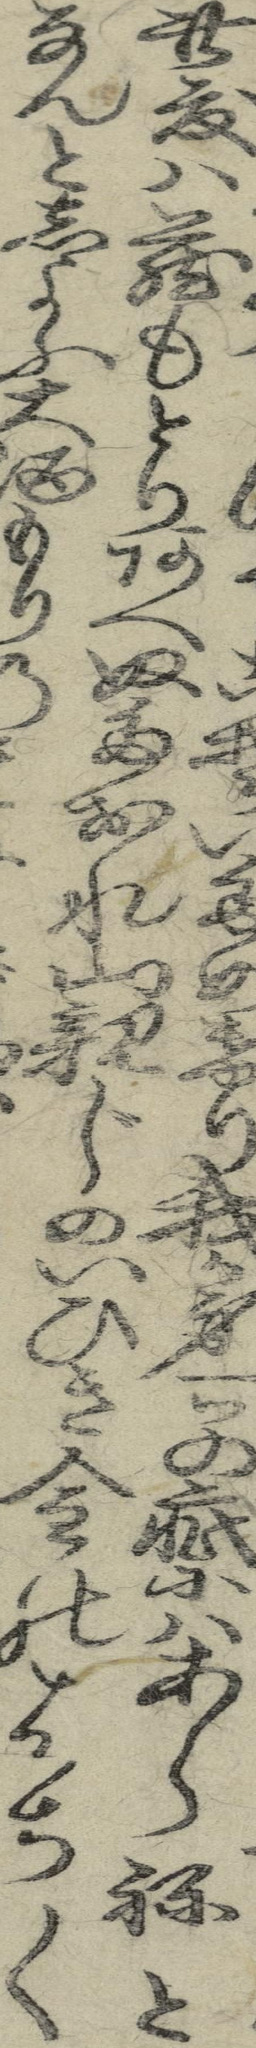此度は蔵もとりあへぬたおれ山親じのいひき金のはち〳〵
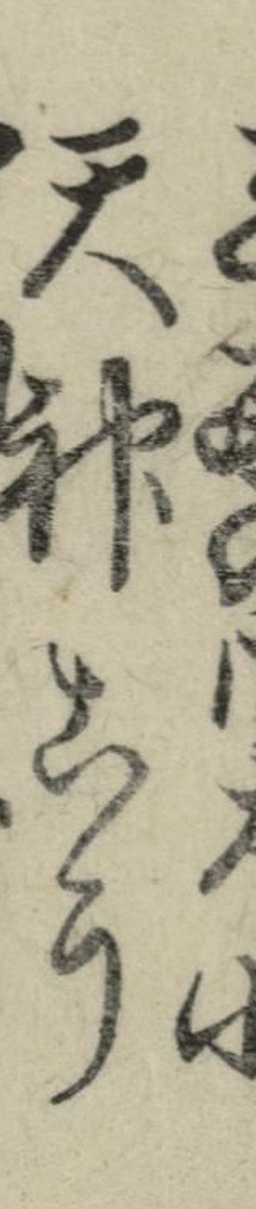天神こう
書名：泰平の美世鹿島百人一首
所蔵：東京大学地震研究所図書室 Earthquake Research Institute Library, The University of Tokyo, JAPAN
